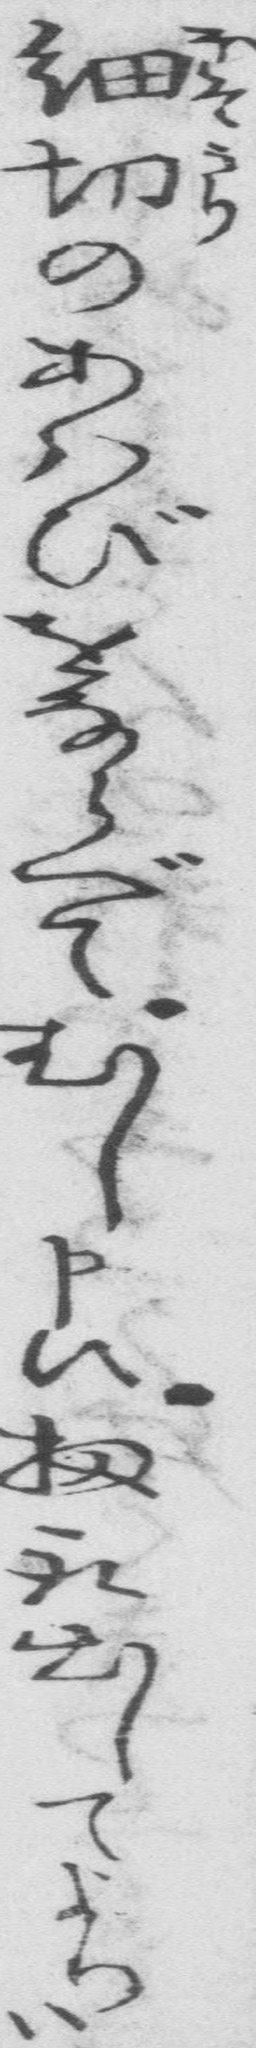細切のあはびをならべて。むし申候。扨取出してよりは
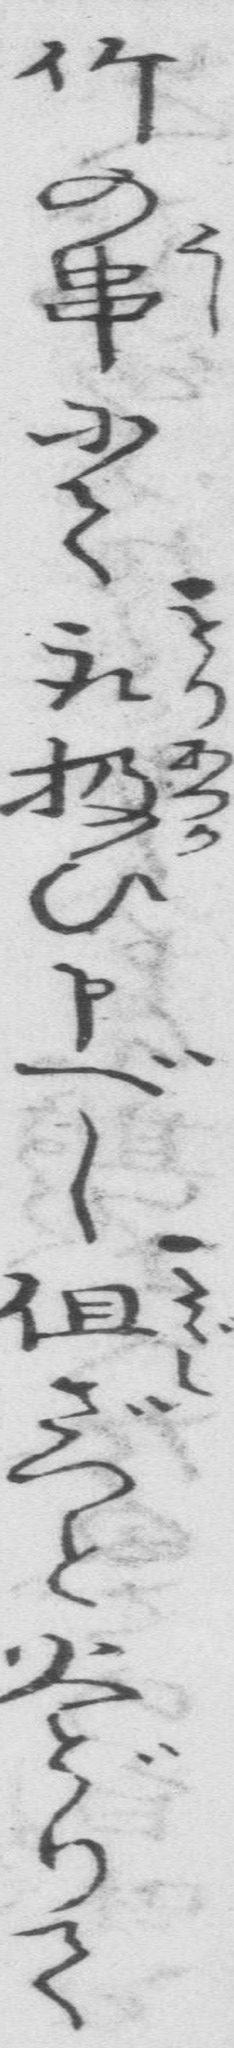竹の串にて。取扱ひ申べし。但ざつと火どりて
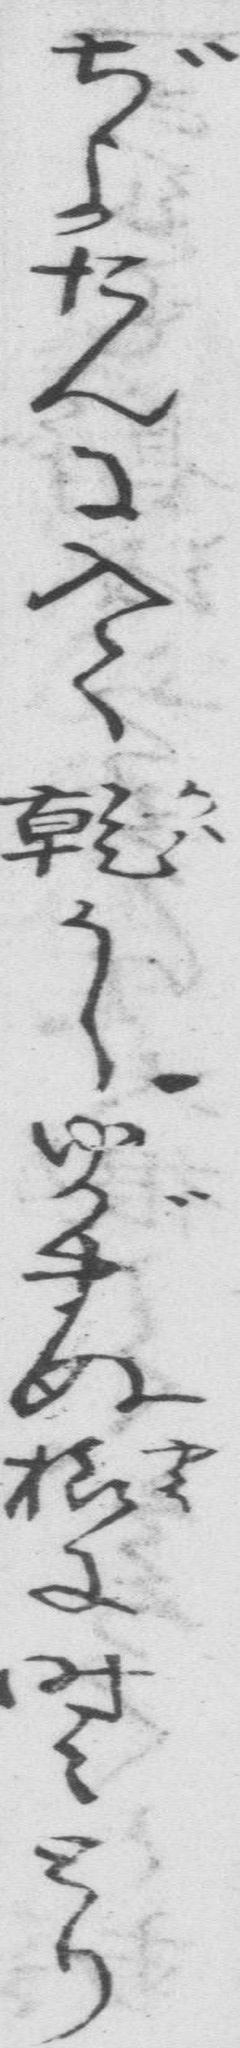ぢよたんに入て乾かし。ゆがまぬ様に時々とり
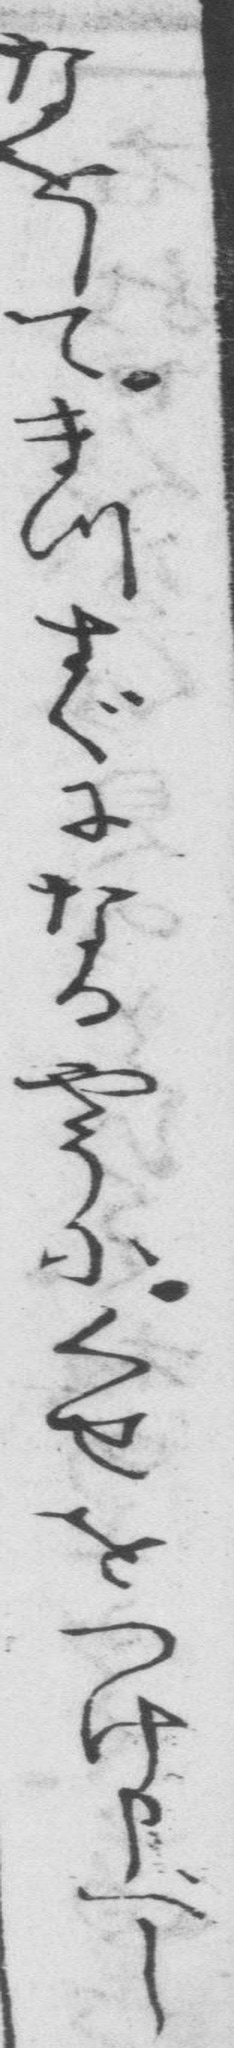なをして。まつすぐになるやうに。くせをつけ申べし
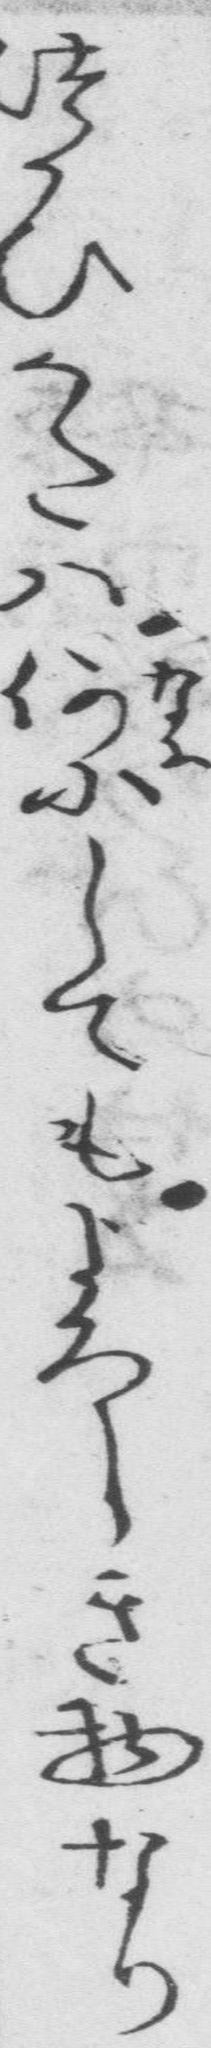つかひかたは。何にしても。よろしき物なり
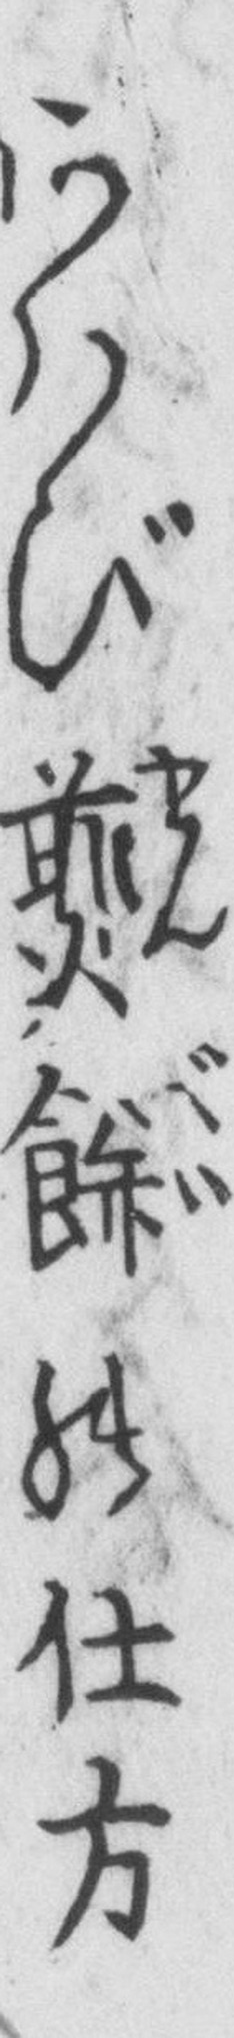あはび煎餅の仕方
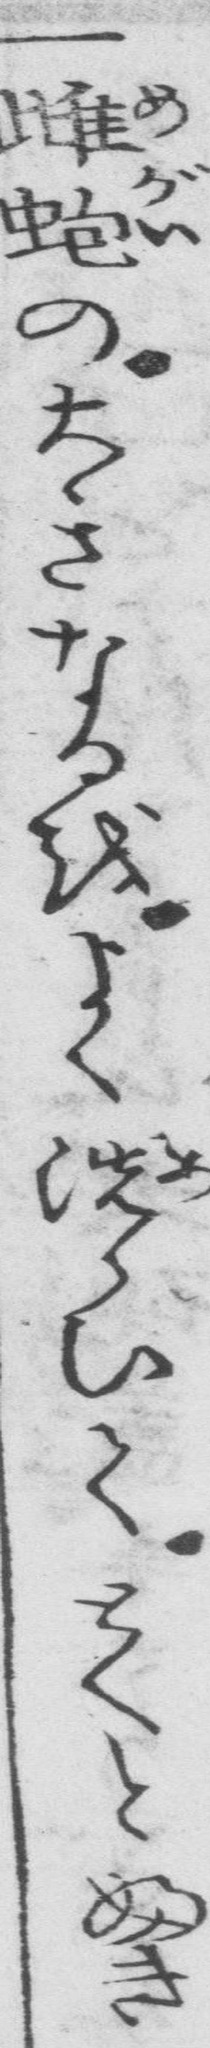一雌鮑の。大きなるを。よく洗らいて。とくとふき
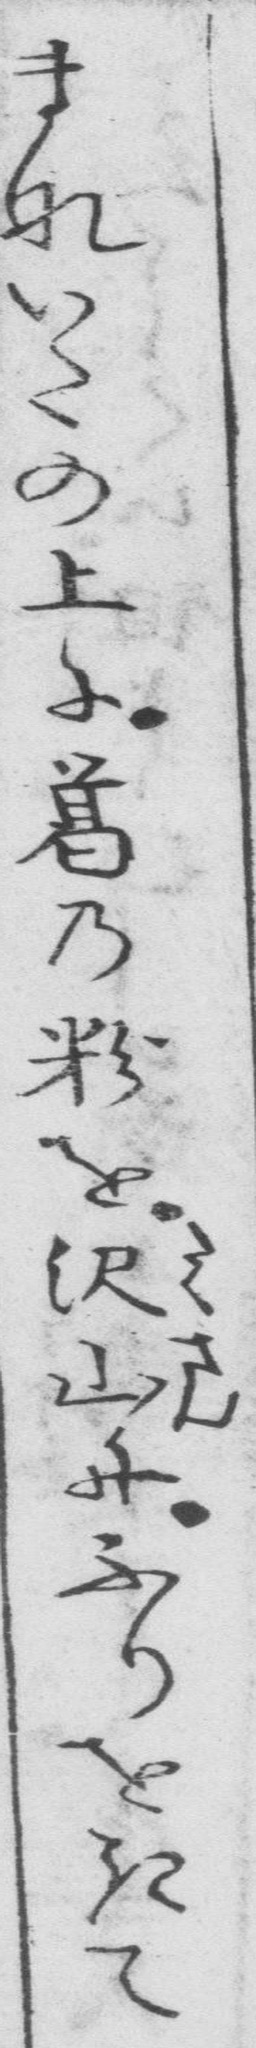まないたの上に。葛の粉を。沢山に。ふりをきて
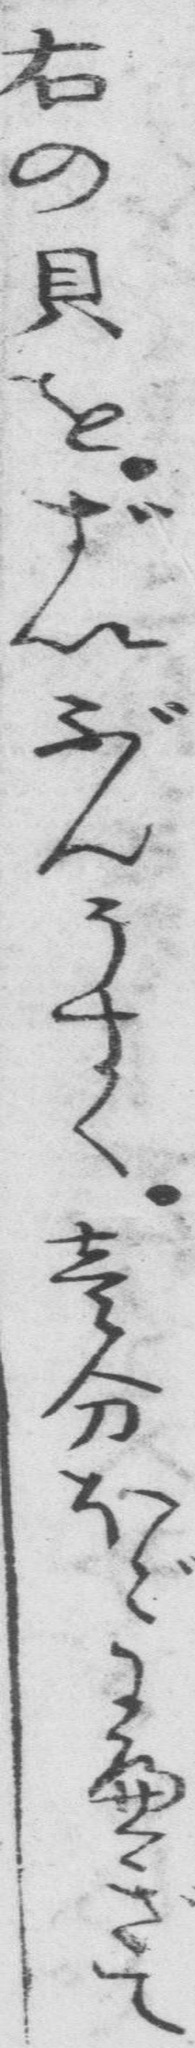右の貝を。ずいぶんうすく。壱分ほどにへぎて
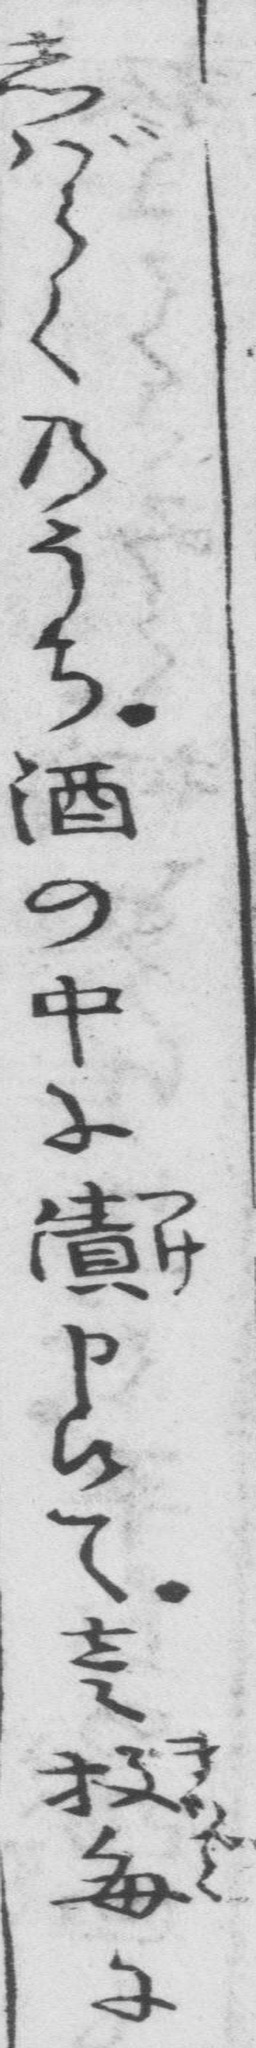しばらくのうち。酒の中に漬申候て。壱枚毎に
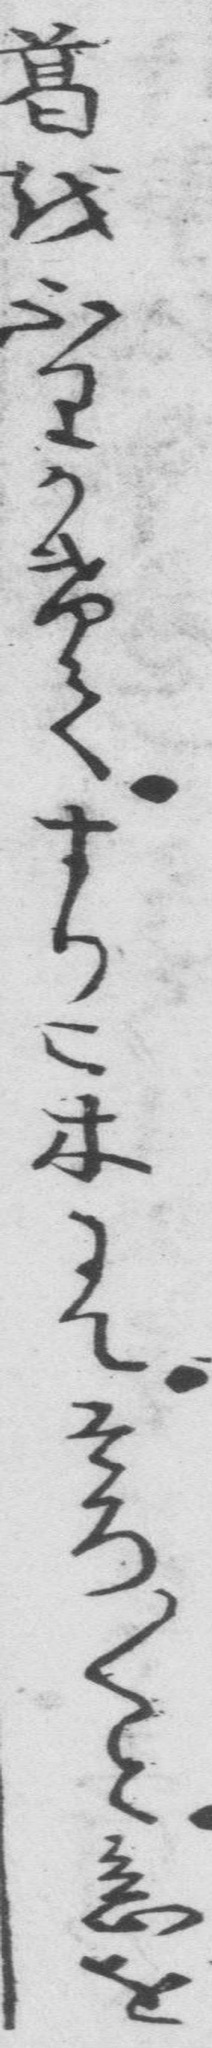葛をふりかけて。すりこ木にて。そろ〳〵と。念を
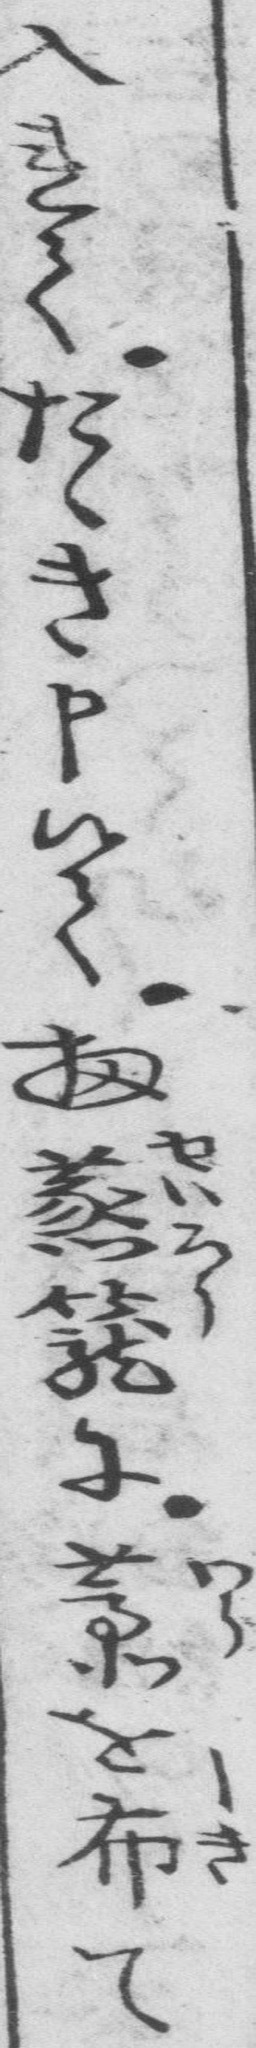入れて。たゝき申候て。扨蒸籠に。藁を布て

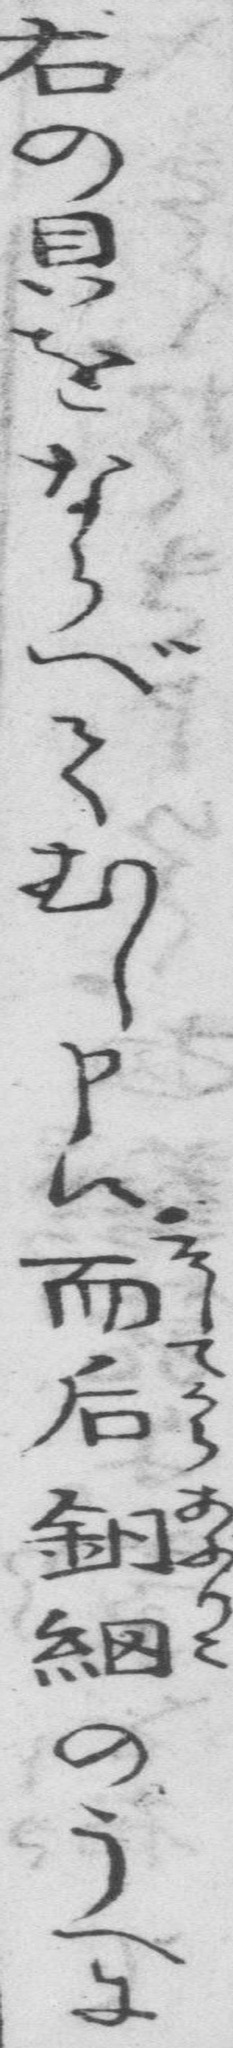右の貝をならべてむし申候。而后銅網のうへに
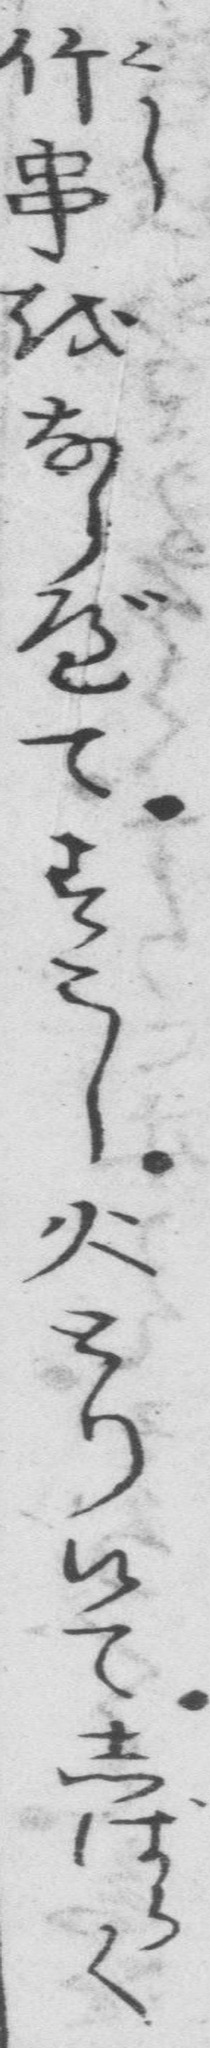竹串をならべて。すこし。火とり候て。しばらく
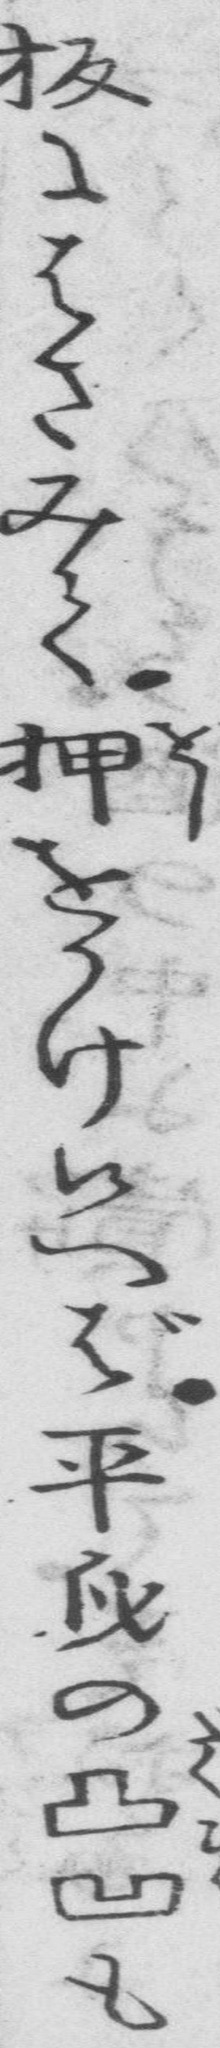板にはさみて。押をかけ候へば。平身の凸凹も
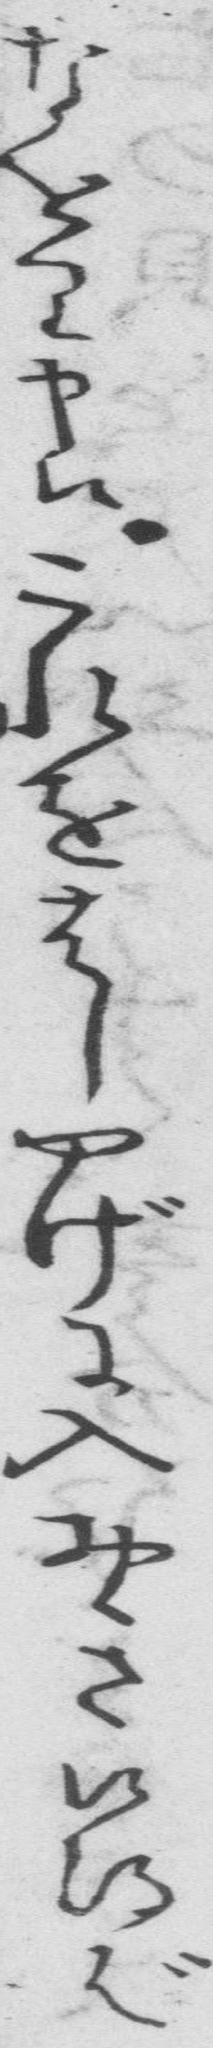なをり申候。これをはしやげに入おき候得ば
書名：萬寳料理秘密箱
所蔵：大阪府立大学学術情報センター 国文学研究資料館
